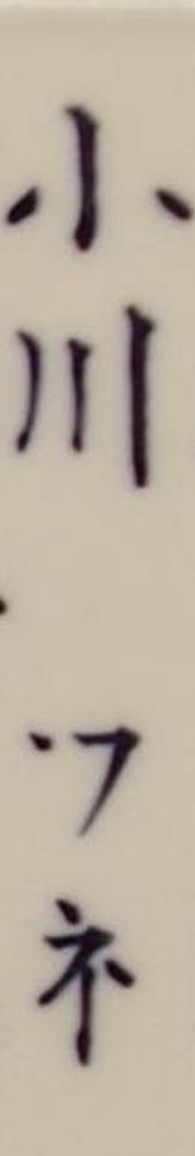小川フネ
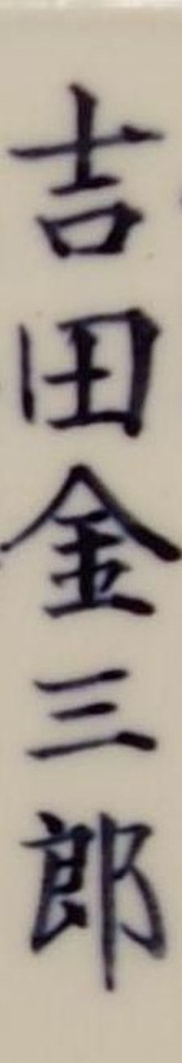吉田金三郎
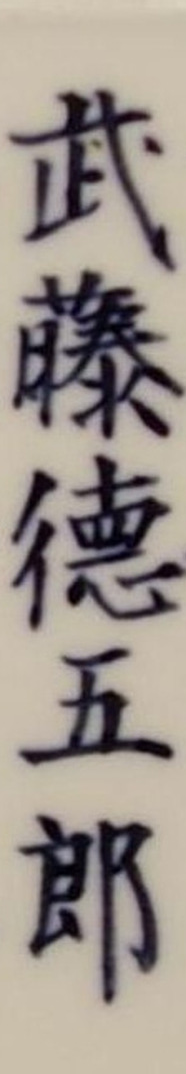武藤徳五郎
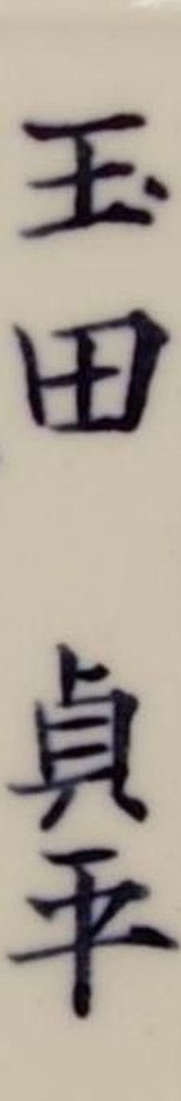玉田貞平
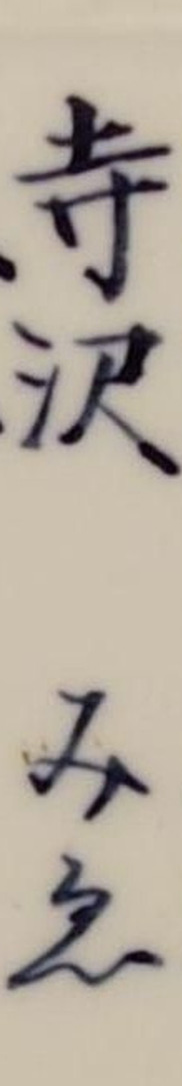寺沢みえ
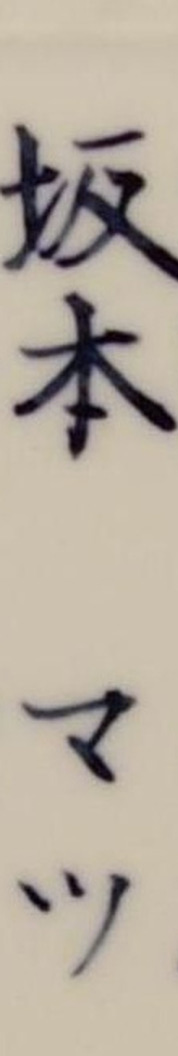坂本マツ
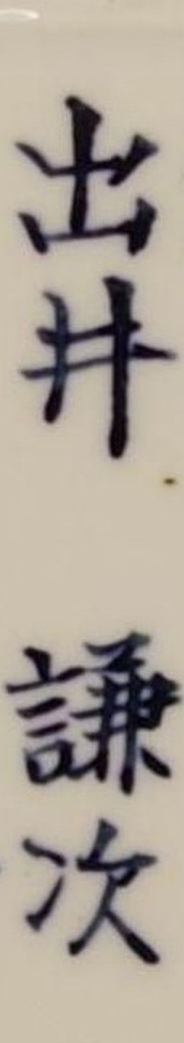出井謙次
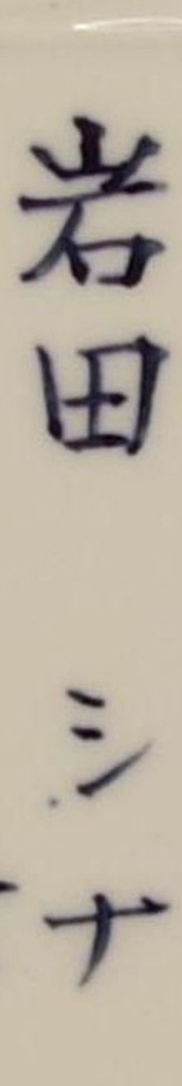岩田シナ
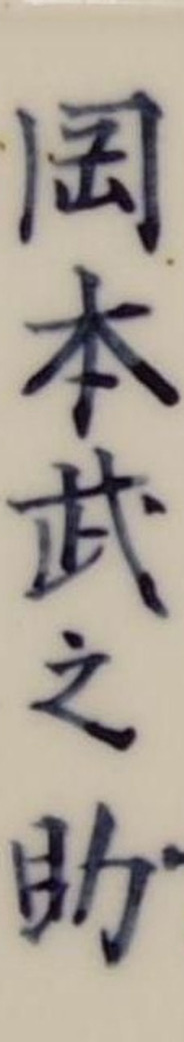岡本武之助
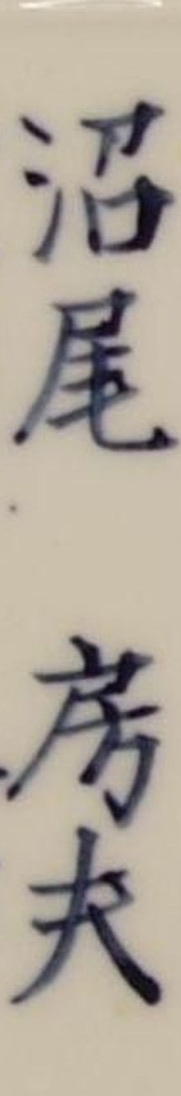沼尾房夫
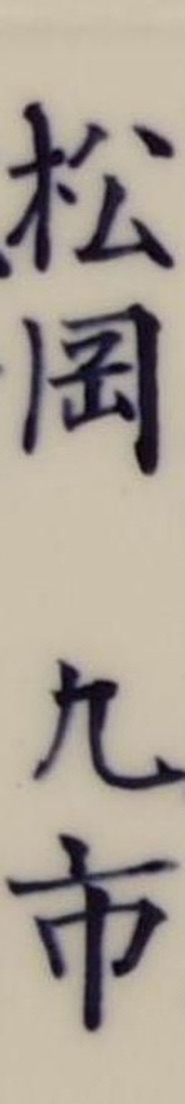松岡九市
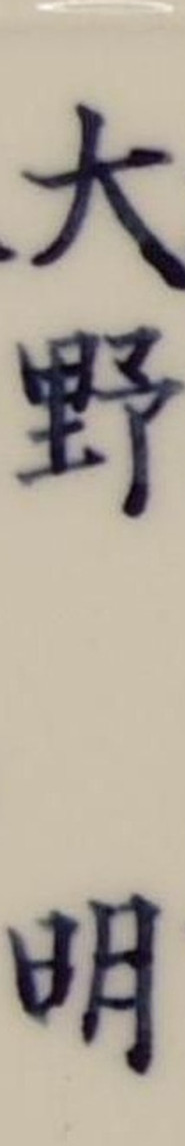大野明
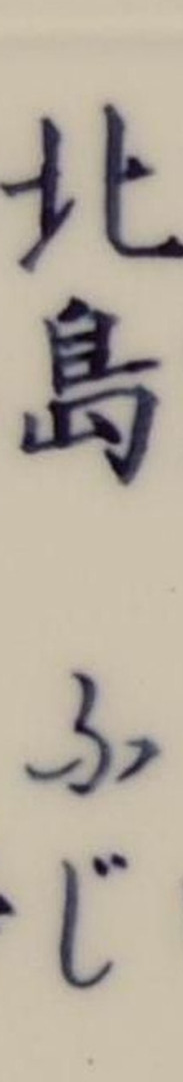北島ふじ
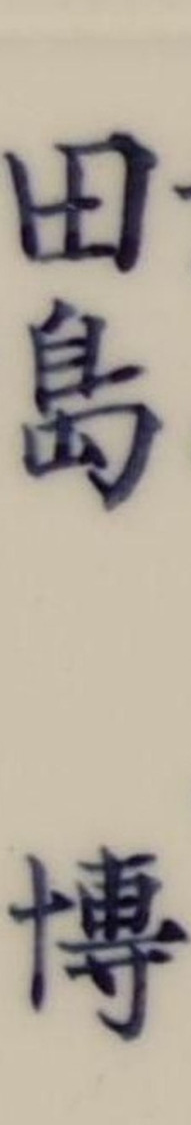田島博
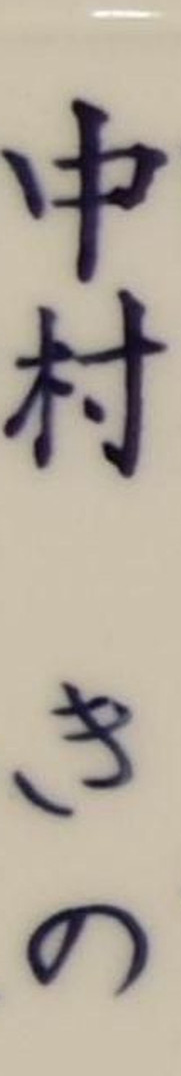中村きの

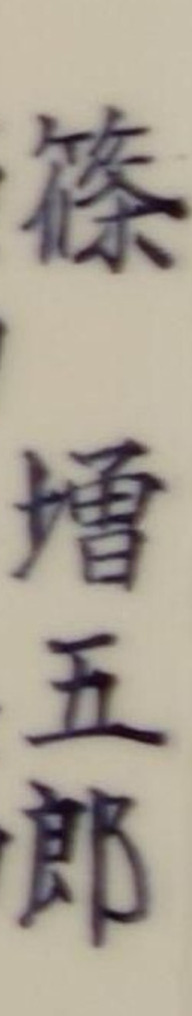篠増五郎
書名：E~L
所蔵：高野山金剛峯寺
